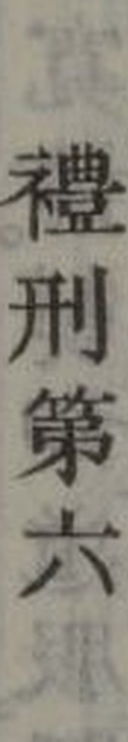禮刑第六
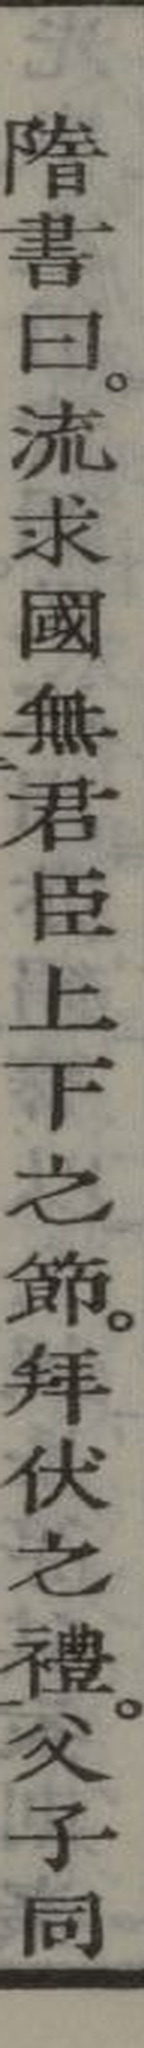隋書曰。流求國無君臣上下之節。拜伏之禮。父子同
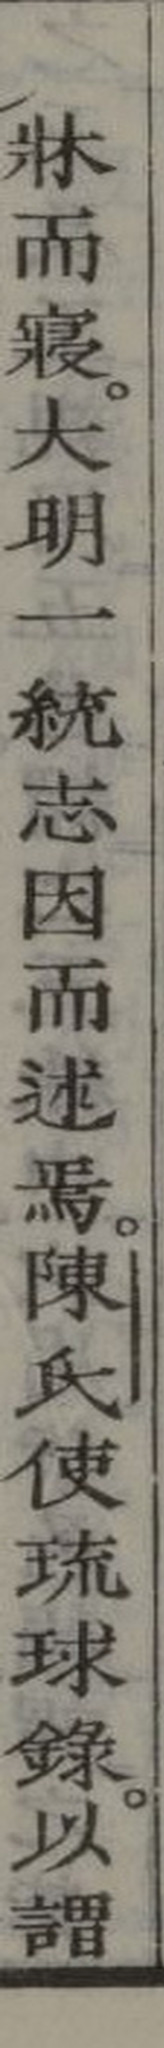牀而寢。大明一統志因而述焉。陳氏使琉球錄。以謂
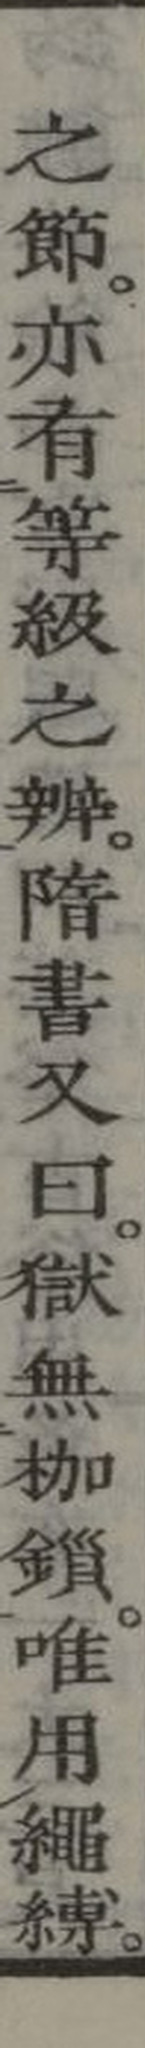之節。亦有等級之辨。隋書又曰。獄無枷鎻。唯用繩縛。
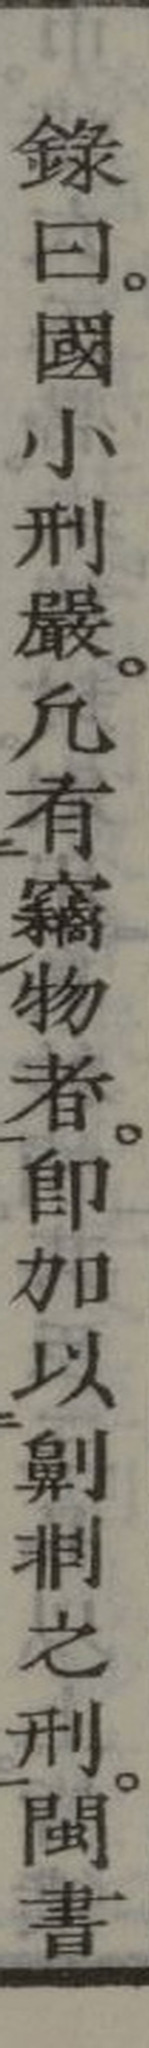錄曰。國小刑嚴。凢有竊物者。卽加以劓剕之刑。閩書
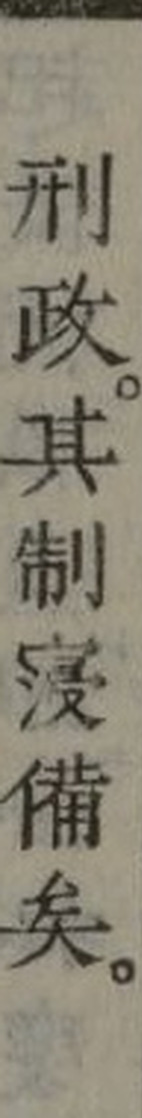刑政。其制寖備矣。
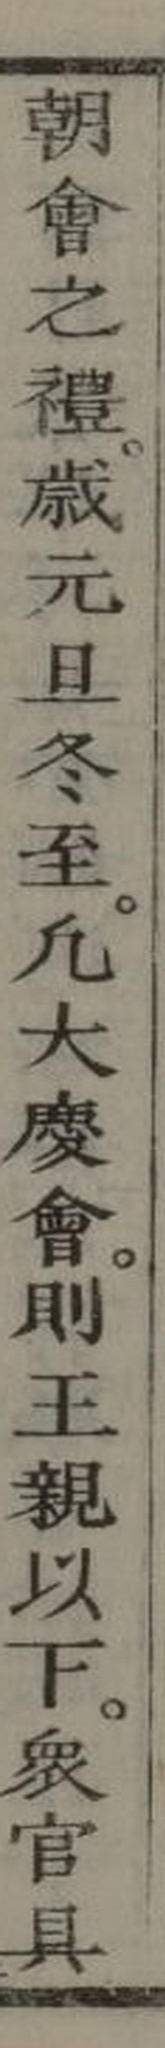朝會之禮。歳元旦冬至。凢大慶會。則王親以下。衆官具
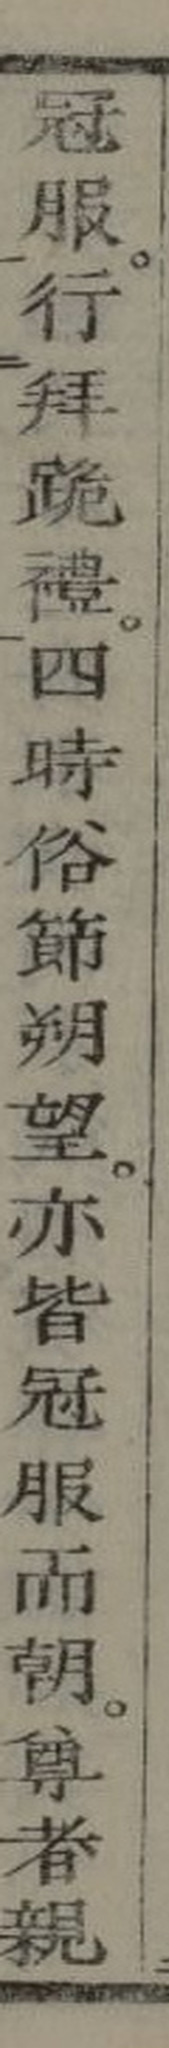冠服。行拜跪禮。四時俗節朔望。亦皆冠服而朝。尊者親
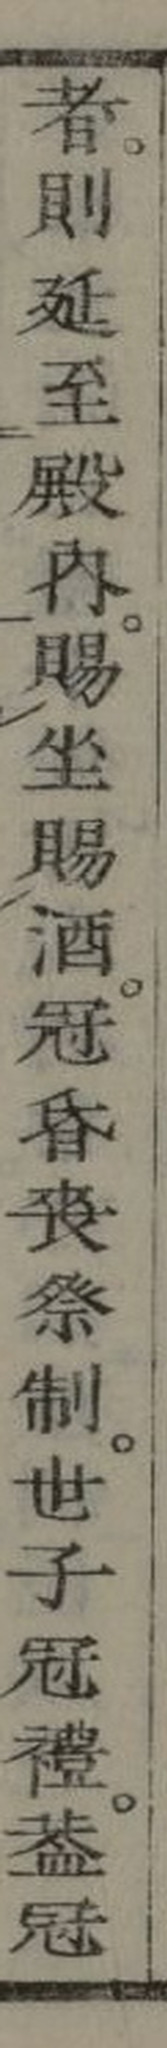者。則延至殿内。賜坐賜酒。冠昏䘮祭制。世子冠禮。葢冠
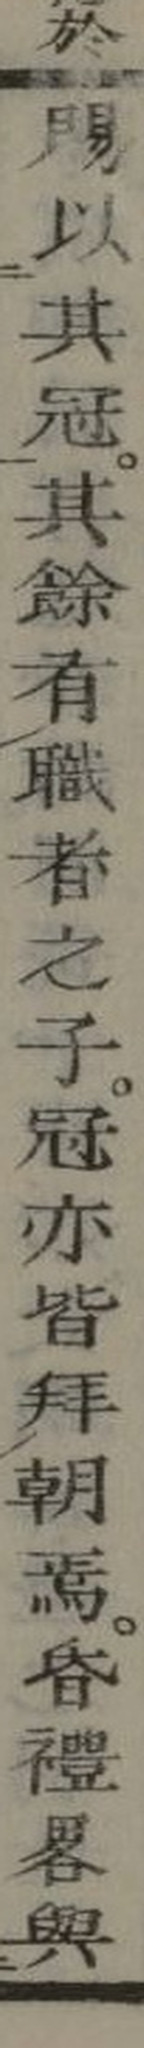賜以其冠。其餘有職者之子。冠亦皆拜朝焉。昏禮畧與

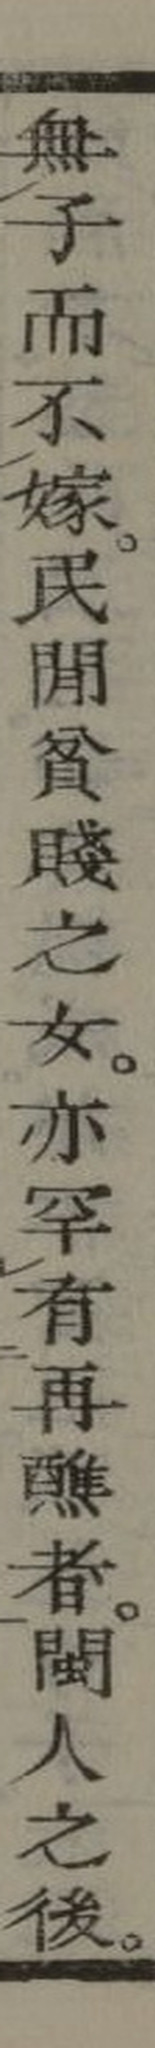無子而不嫁。民閒貧賤之女。亦罕有再醮者。閩人之後。
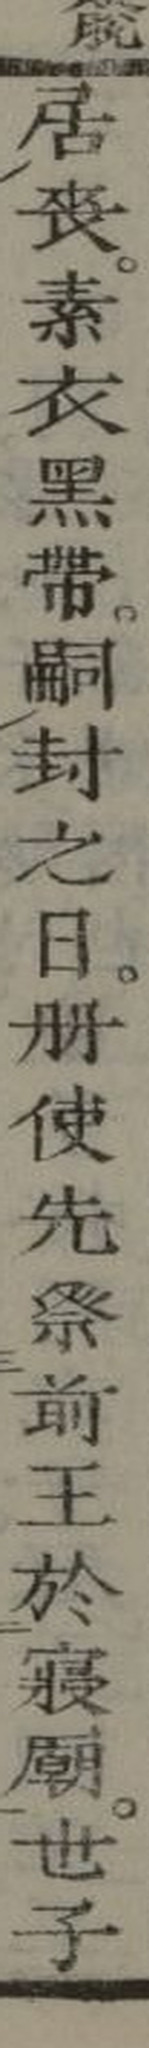居䘮。素衣黑帯。嗣封之日。册使先祭前王於寢廟。世子
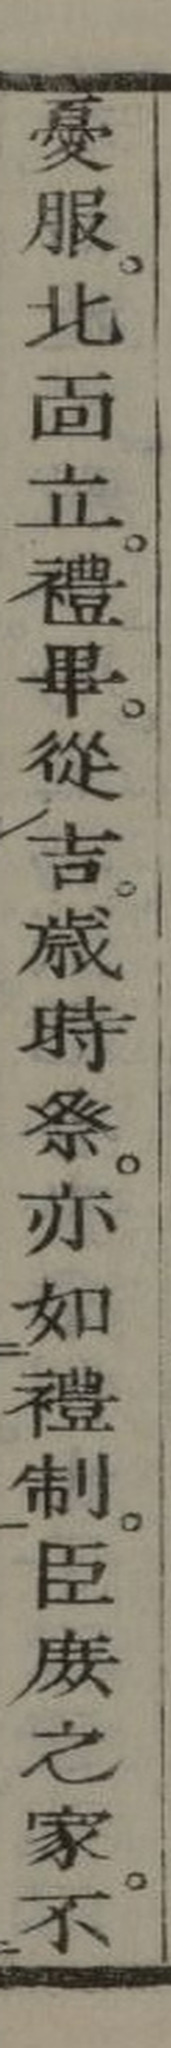憂服。北靣立。禮畢。從吉。歳時祭。亦如禮制。臣庻之家。不
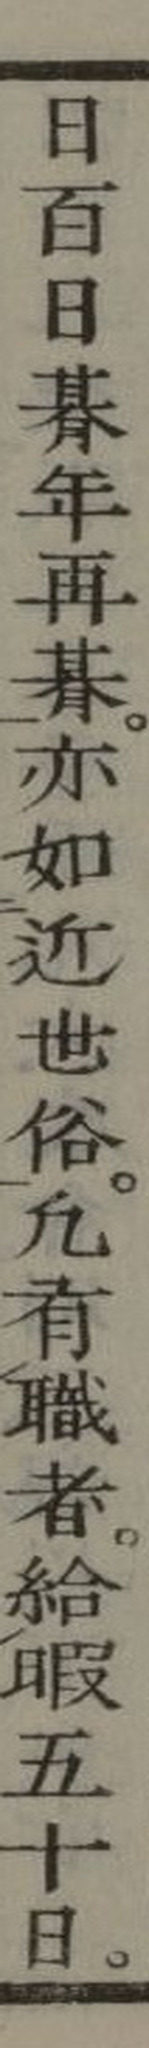日百日朞年再朞。亦如近世俗。凢有職者。給暇五十日。
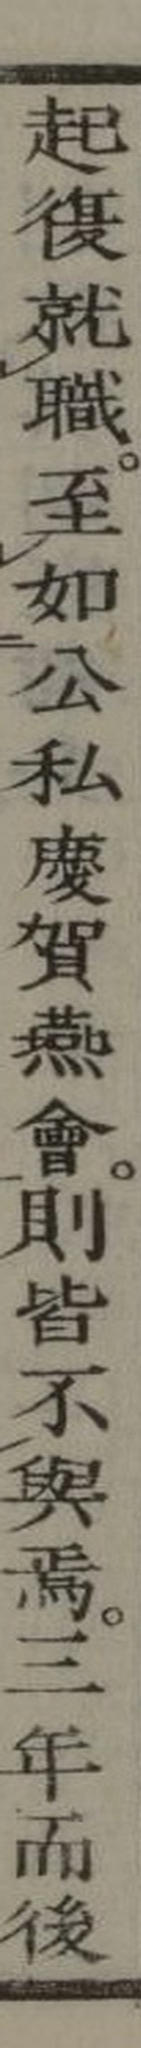起復就職。至如公私慶賀燕會。則皆不與焉。三年而後
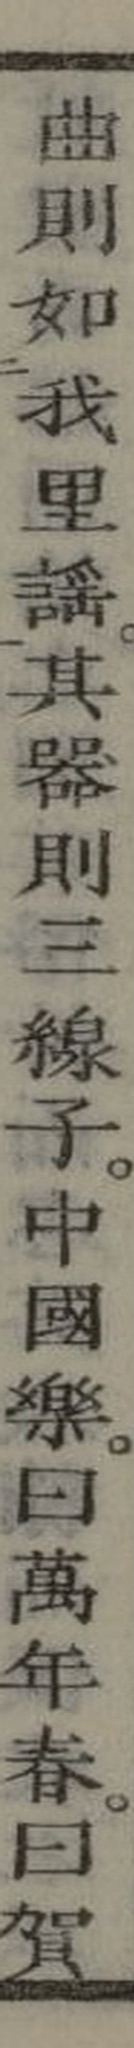曲則如我里謡。其器則三線子。中國樂。曰萬年春。曰賀
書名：南島志 呂
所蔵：University of the Ryukyus Library
